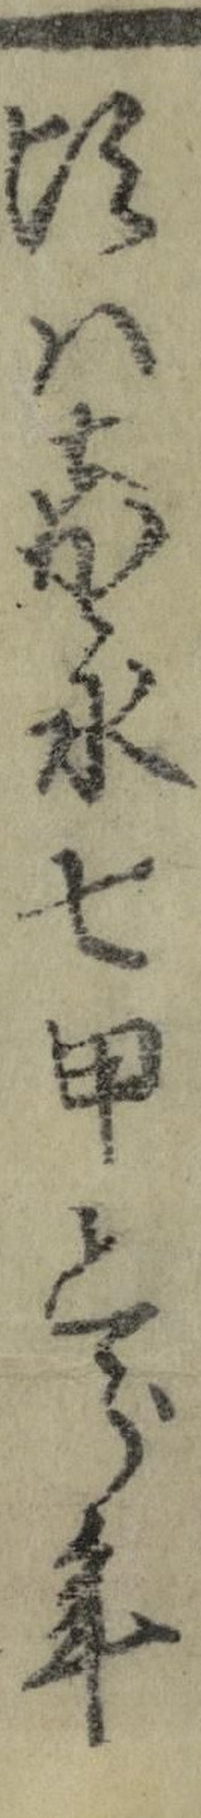頃は嘉永七甲とら年
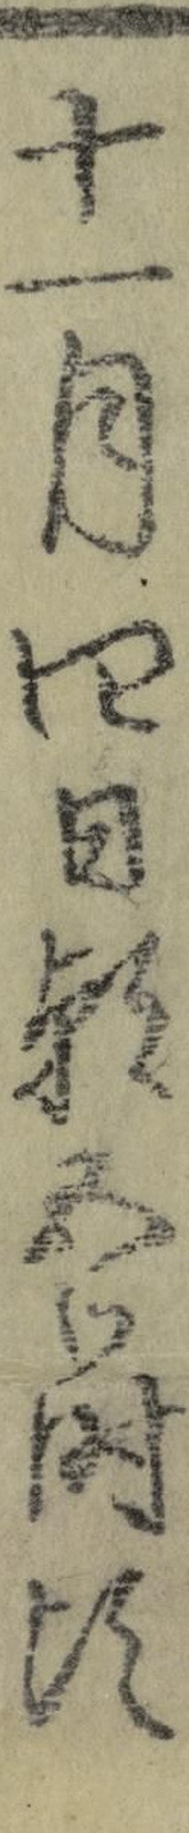十一月四日朝五ツ時頃
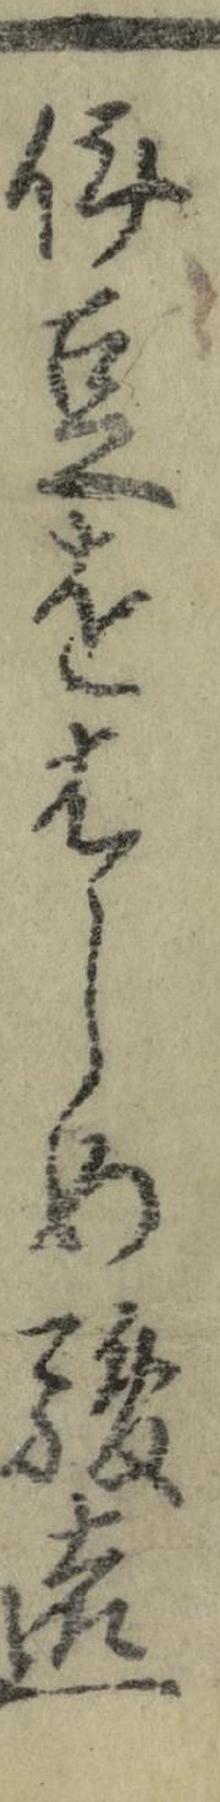伊豆をはしめ駿遠
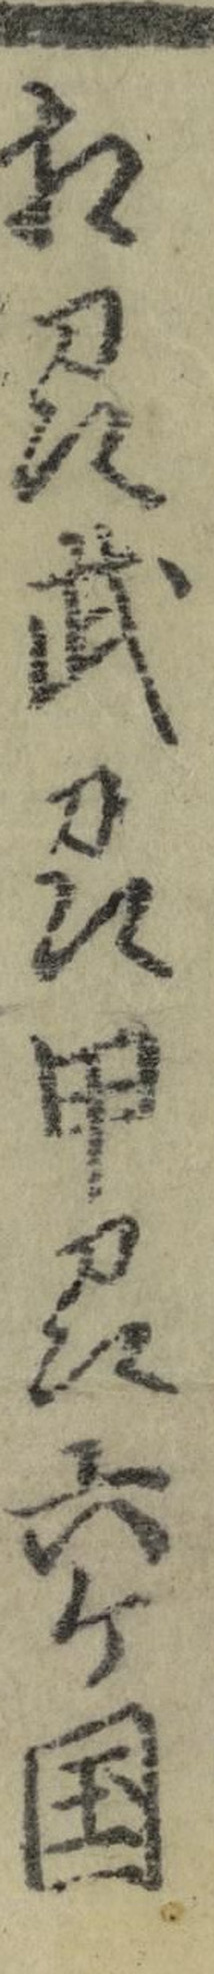相州武州甲州六ヶ国
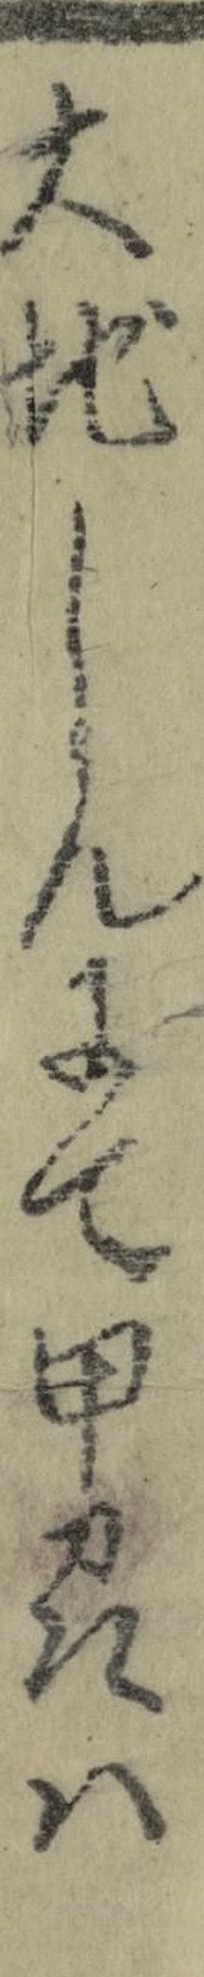大地しんにて甲州は
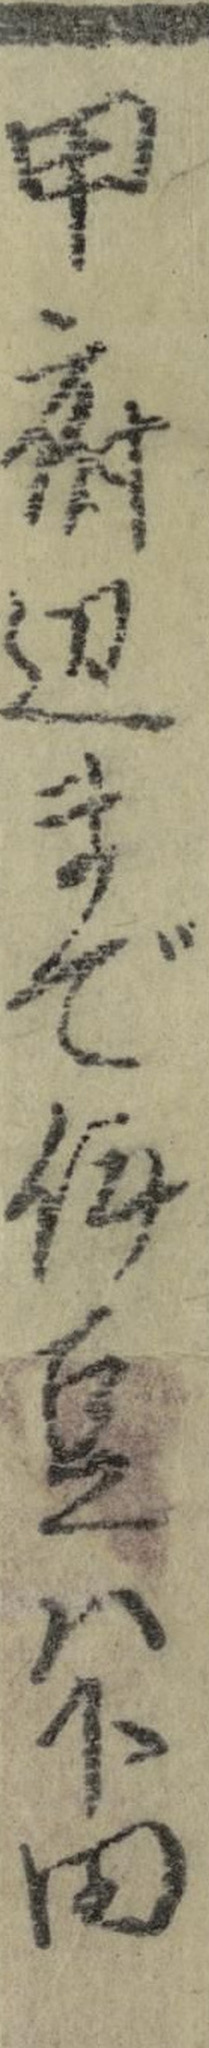甲府辺まで伊豆は下田
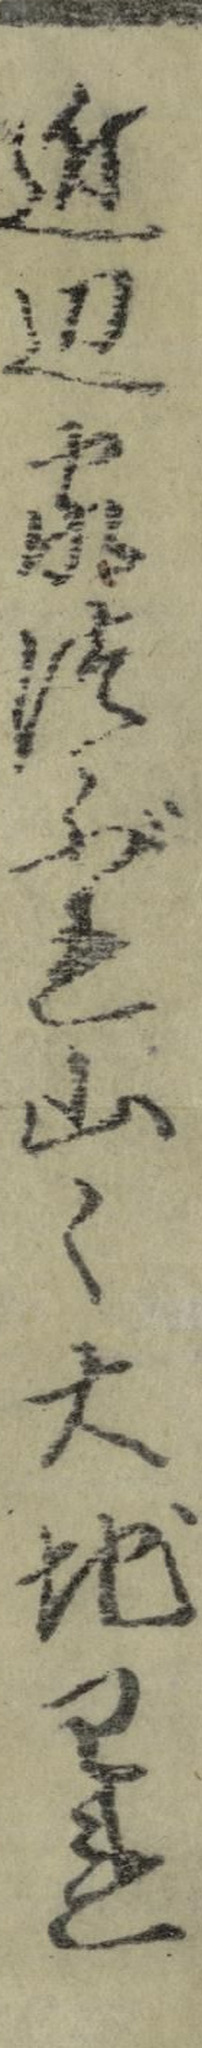近辺家つぶれ山〻大地われ
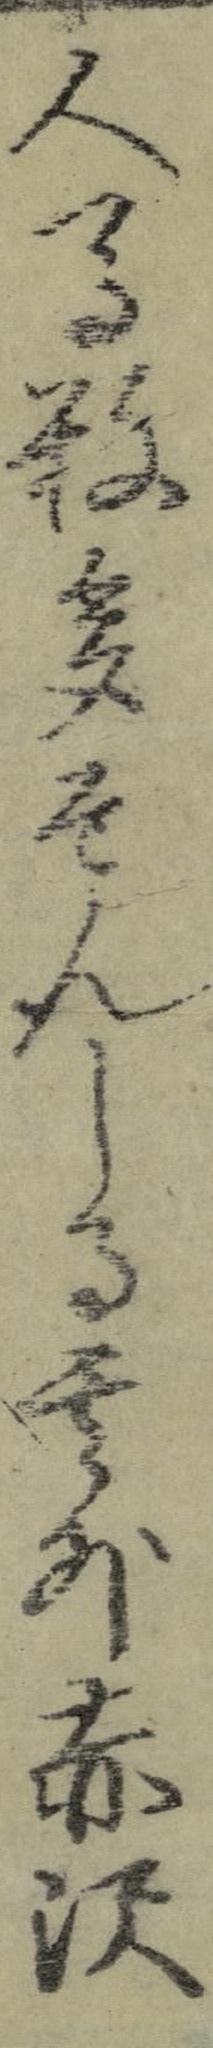人馬数多そんじる其外赤沢
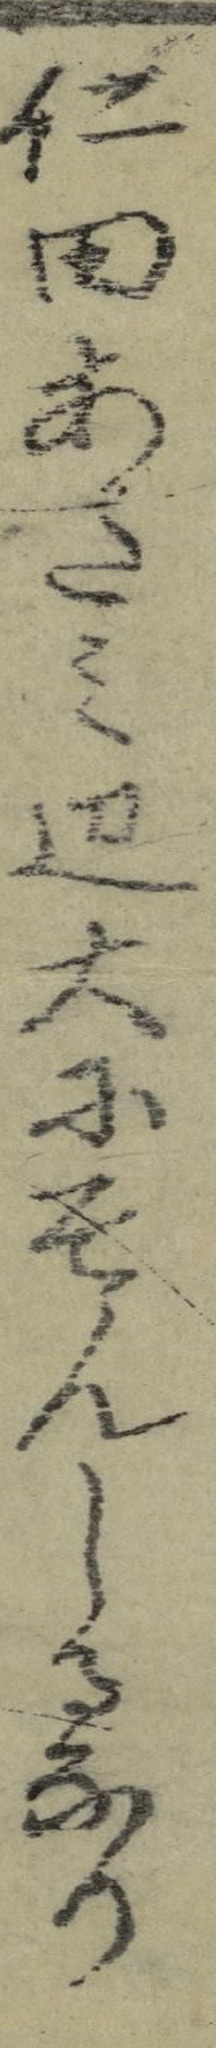仁田あたみ辺大にそんしるなり
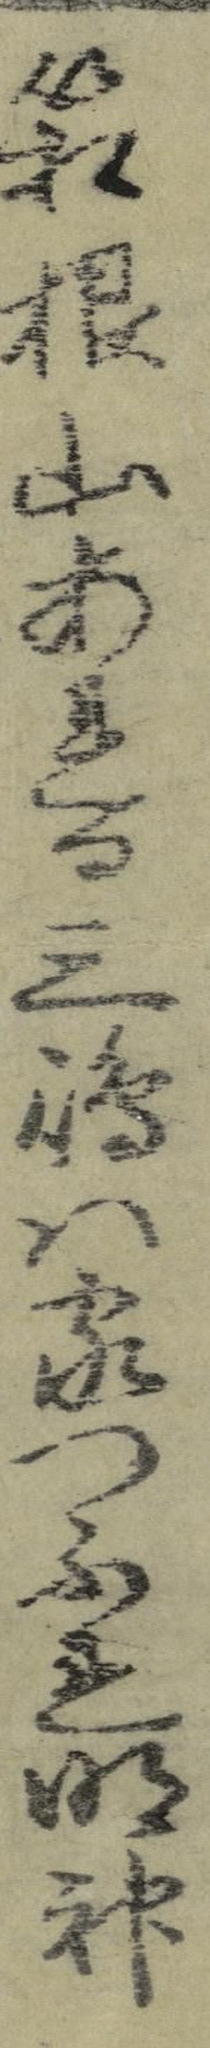箱根山あれる三嶋は家つふれ明神
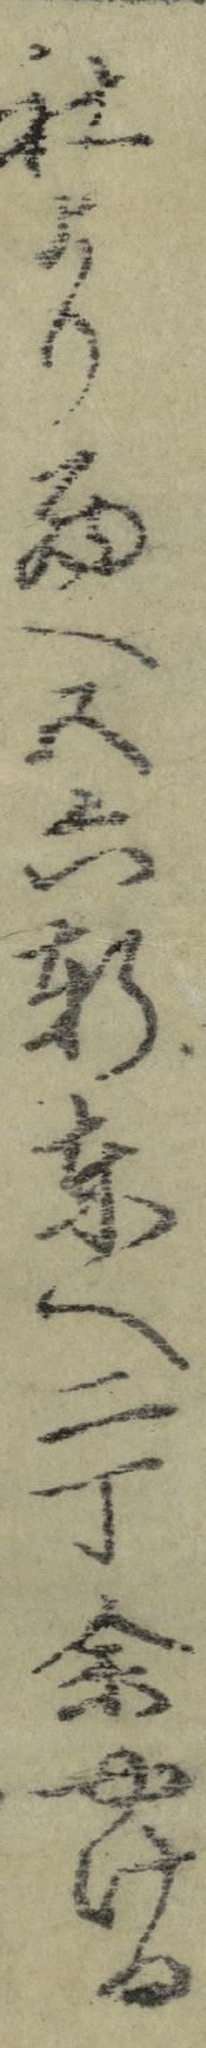社より西へ五六軒東へ二丁余やける
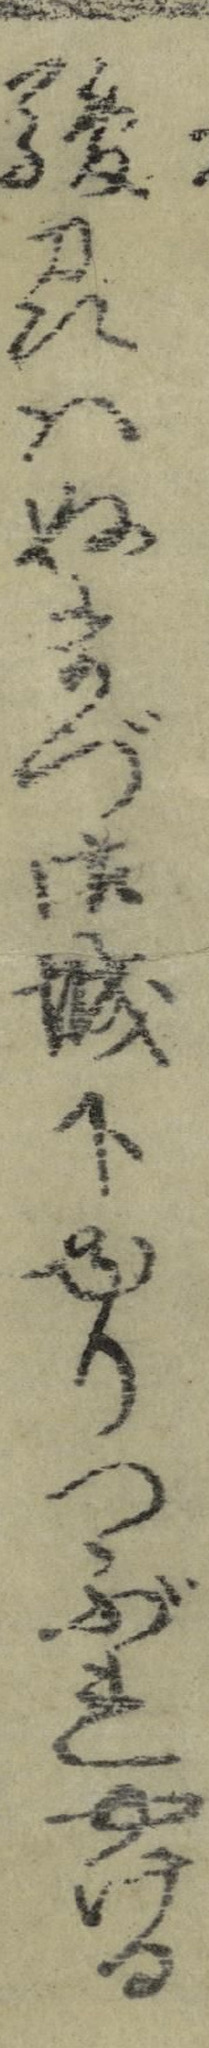駿州はぬまづ御城下ゆりつぶれやける
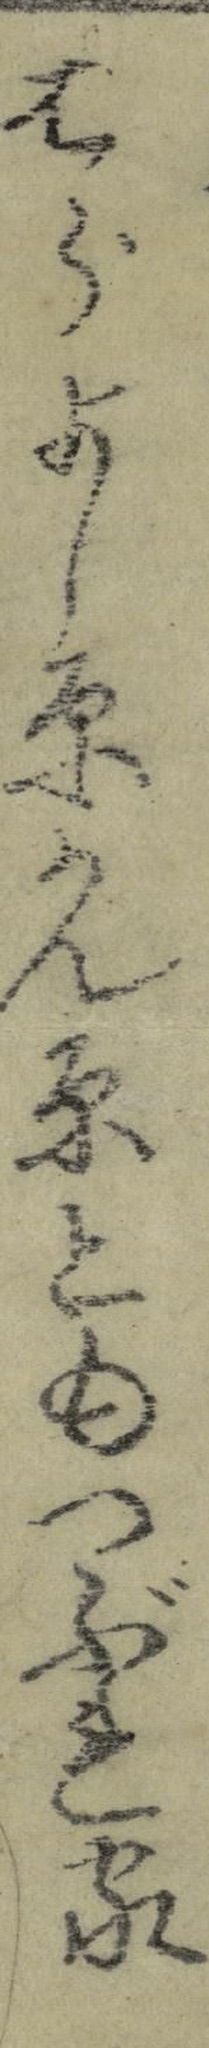はらよし原かん原ともつぶれ家
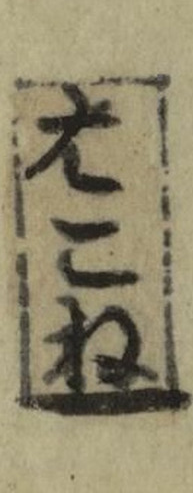はこね
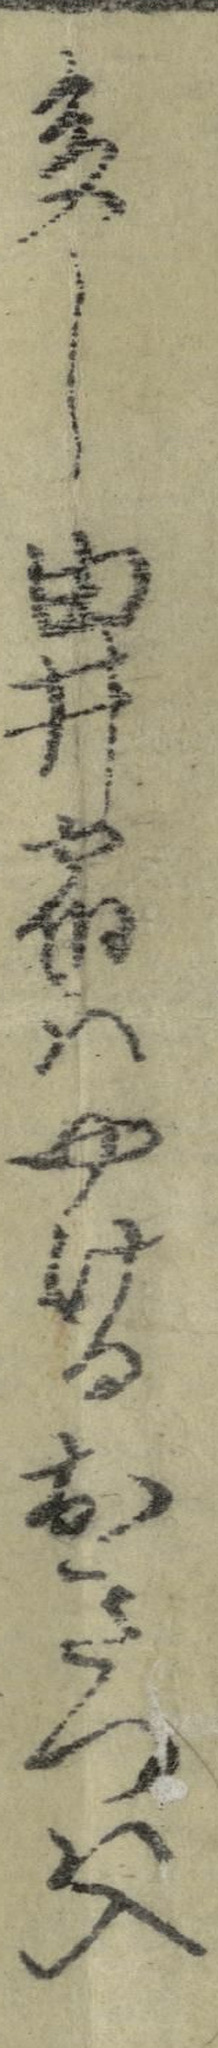多し由井宿はやけるおきつは入
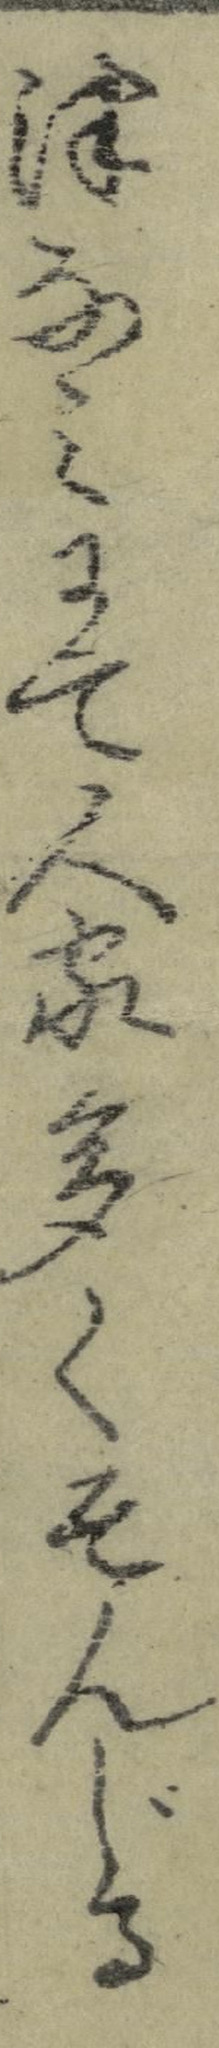津なみにて人家多くそんじる
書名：[安政東南海地震に関する瓦版]
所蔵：東京大学地震研究所図書室 Earthquake Research Institute Library, The University of Tokyo, JAPAN
